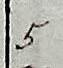5
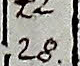28
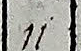11
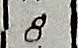8
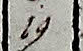19
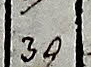39
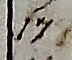17
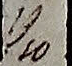10
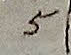5
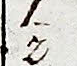2
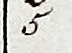5
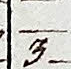3
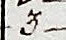3
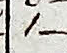1
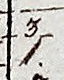1
